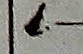1.
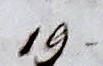19
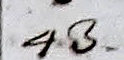4.
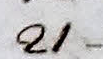21
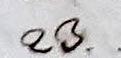23.
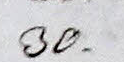30.
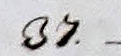37.
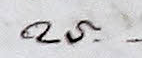25.
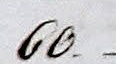60.
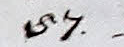57.
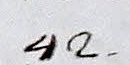42
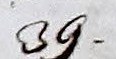39
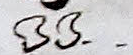33.
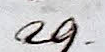29
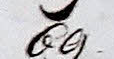69
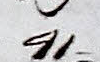41
